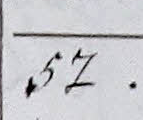52
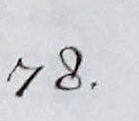78.
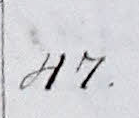47
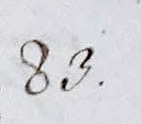83.
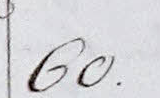60.
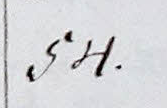54.
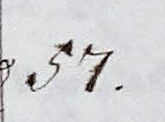57.
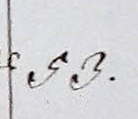53
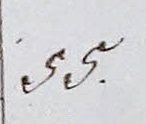55.
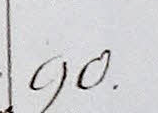90.
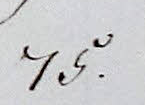75.
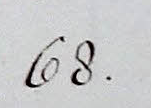68.
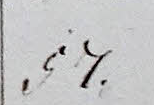57.
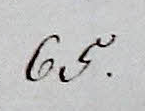65.
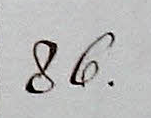86.
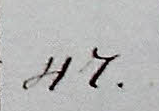47.
